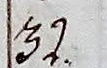32.
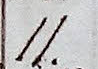11.
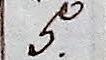5.
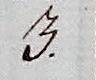3.
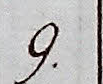9.
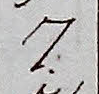7.
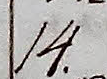14.
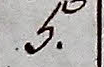5.
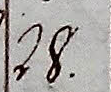28.
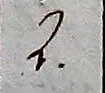2.
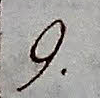9.
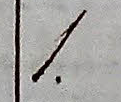1.
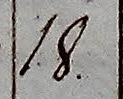18.
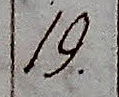19.
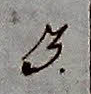3.
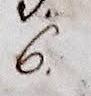6.
